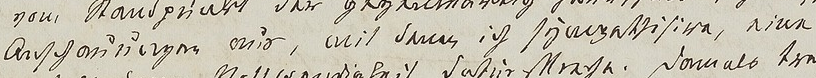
Anschauungen aus, mit denen ich sympathisire, eine
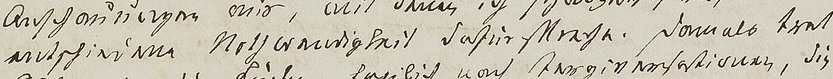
entschiedene Nothwendigkeit dafür spreche. Damals trat
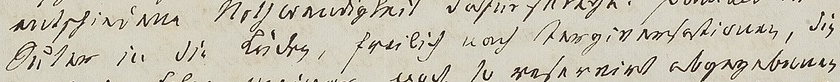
Suter in die Lücke, freilich nach Tergiversationen, die
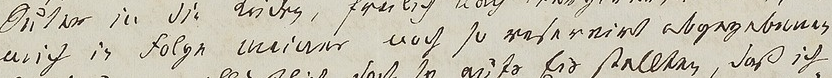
mich in Folge meiner noch so reservirt abgegebenen
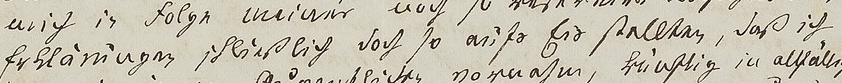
Erklärungen schließlich doch so aufs Eis stellten, daß ich
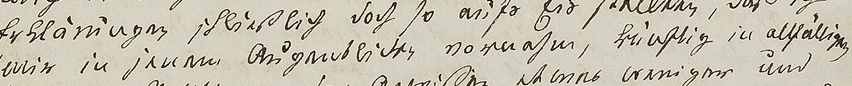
mir in jenem Augenblicke vornahm, künftig in allfälligen
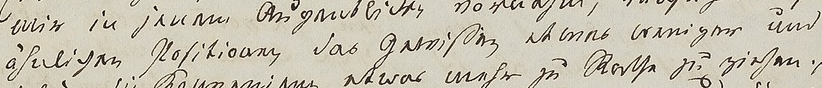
ähnlichen Positionen das Gewissen etwas weniger und
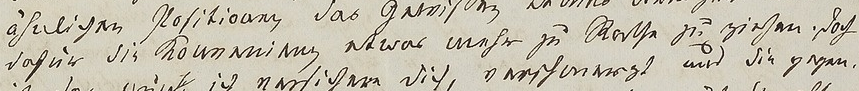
dafür die Konvenienz etwas mehr zu Rathe zu ziehen. Doch
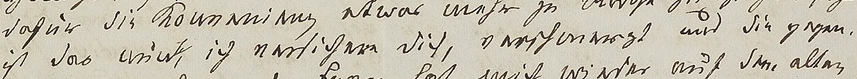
ist das nun, ich versichere Dich, verschmerzt und die gegen-
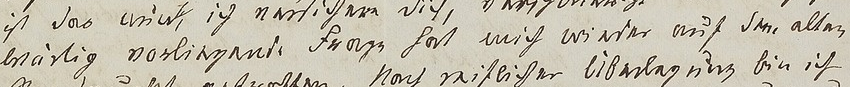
wärtig vorliegende Frage hat mich wieder auf dem alten
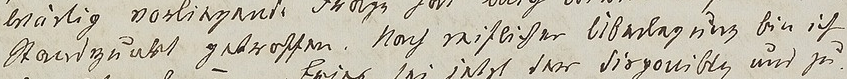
Standpunkt getroffen. Nach reiflicher Überlegung bin ich
